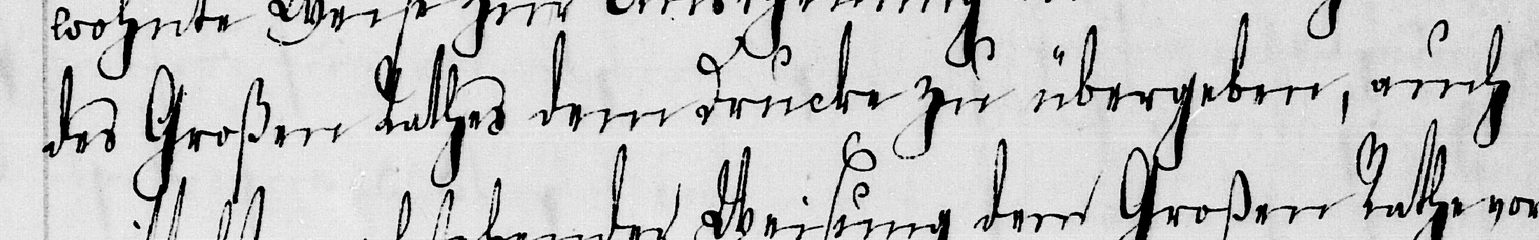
des Großen Rathes dem Drucke zu übergeben, auch
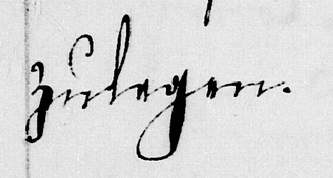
zulegen.
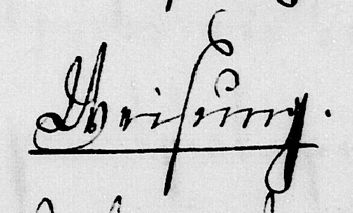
Weisung.
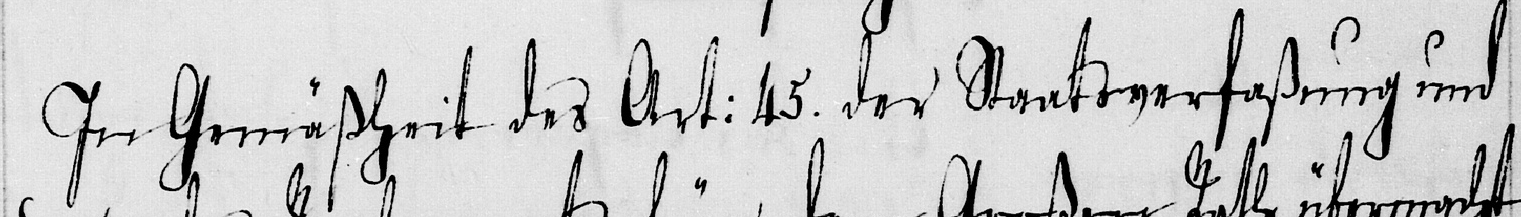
In Gemäßheit des Art: 45. der Staatsverfaßung und
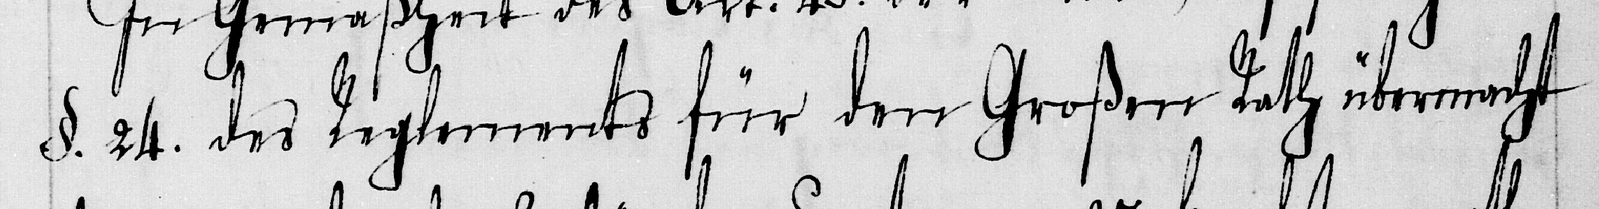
§. 24. des Reglements für den Großen Rath übermacht
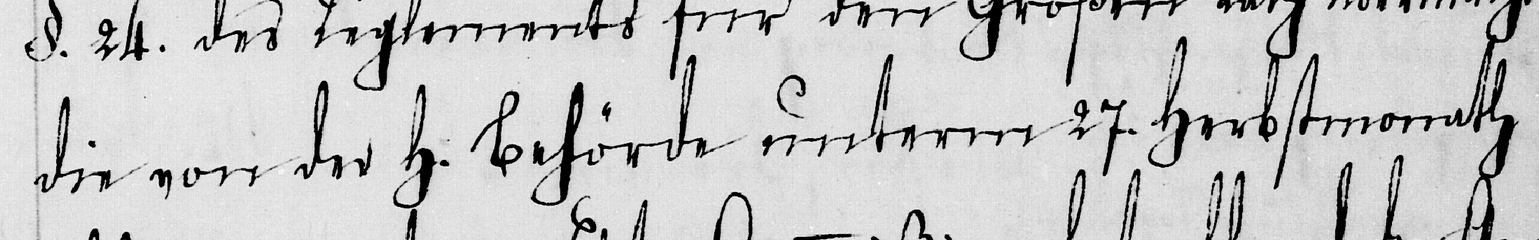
die von der H. Behörde unterm 27. Herbstmonath
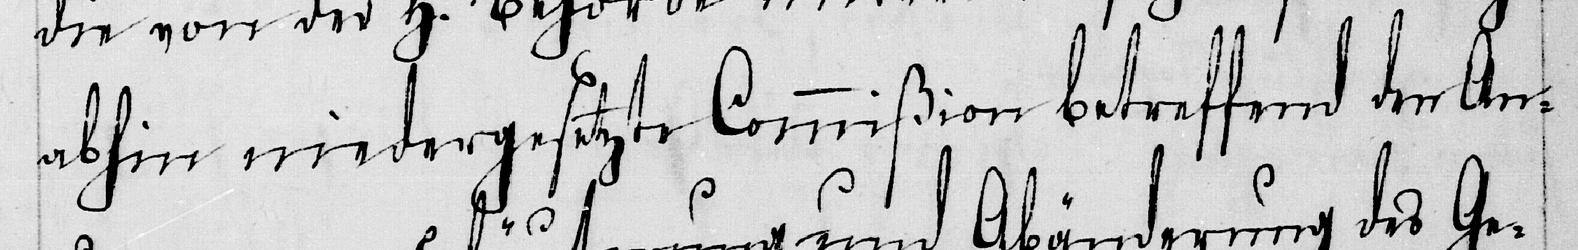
abhin niedergesetzte Commißion betreffend den An¬
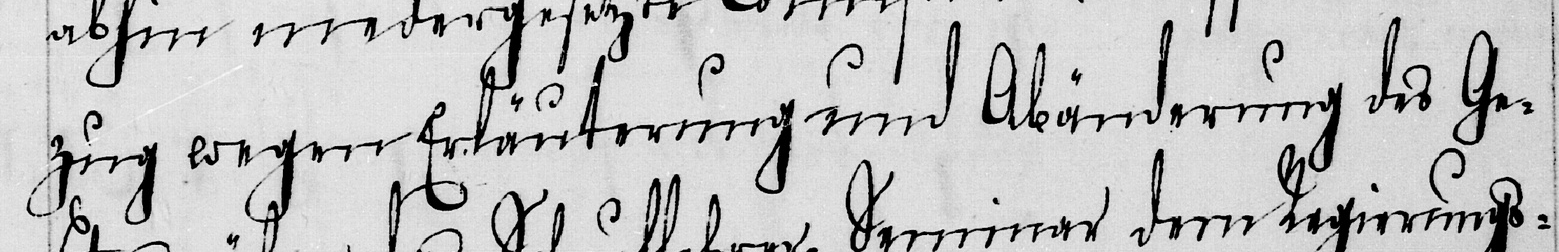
zug wegen Erläuterung und Abänderung des Ge¬
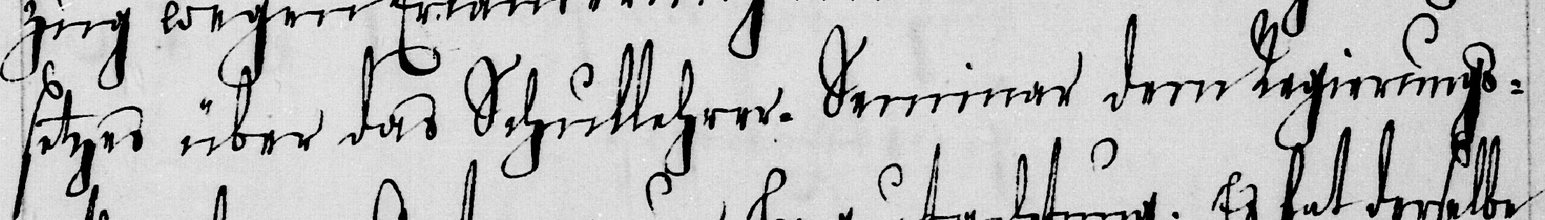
setzes über das Schullehrer-Seminar dem Regierungs¬
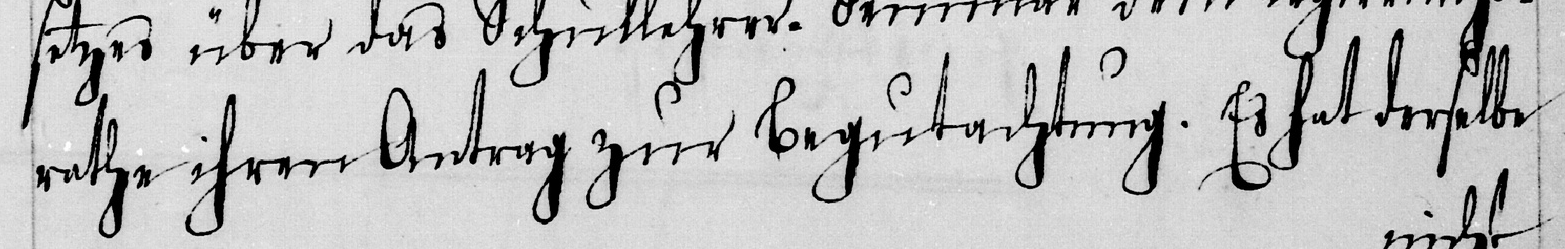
rathe ihren Antrag zur Begutachtung. Es hat derselbe
